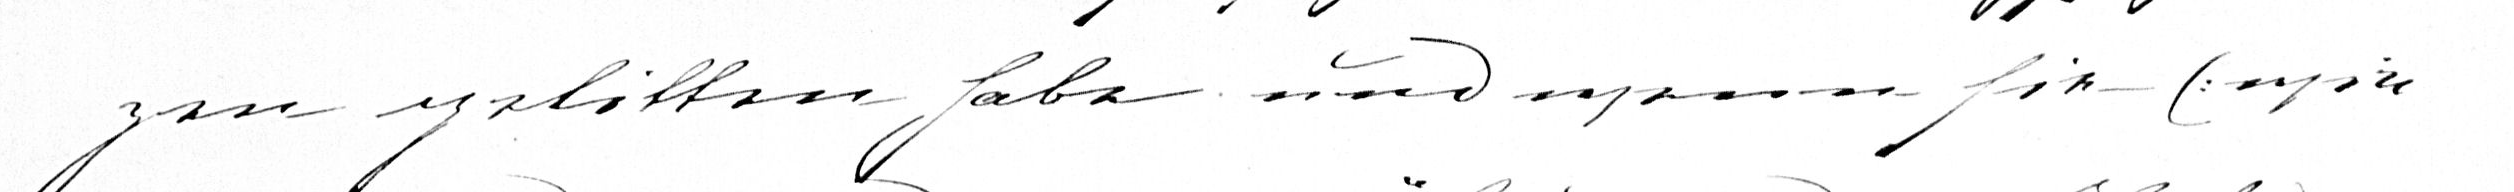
zen gelitten habe und wenn sie (:wie
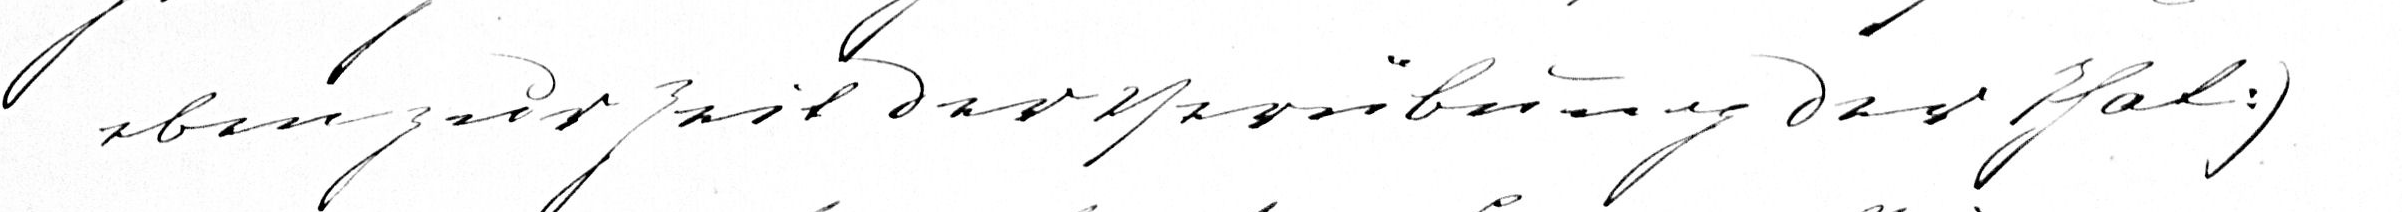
eben zur Zeit der Verübung der That:)
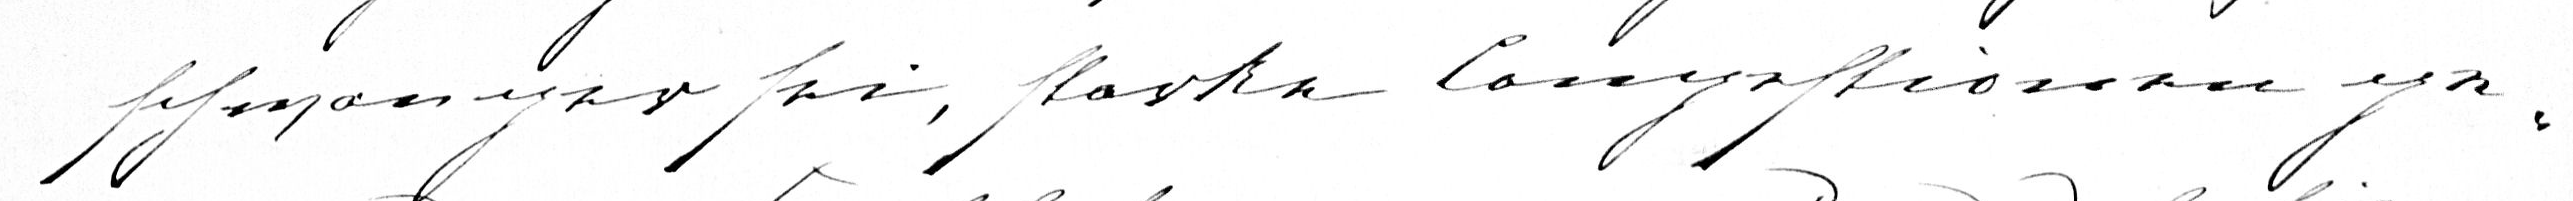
schwanger sei, starke Congestionen ge¬
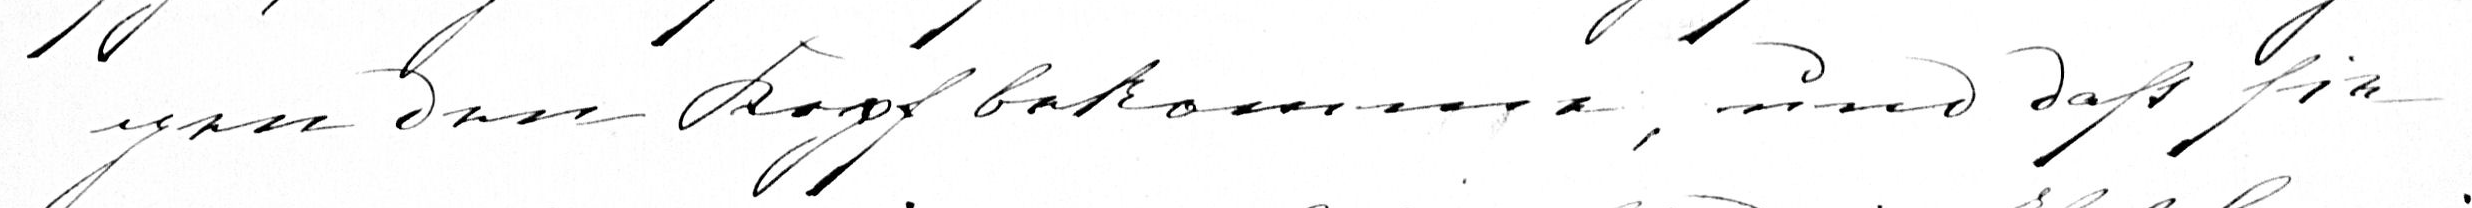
gen den Kopf bekomme, und daß sie
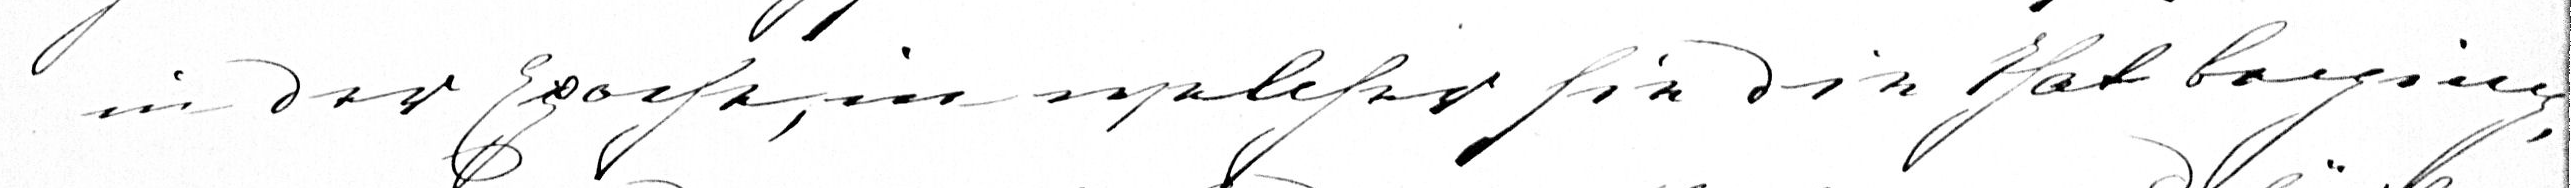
in der Epoche, in welcher sie die That beging,
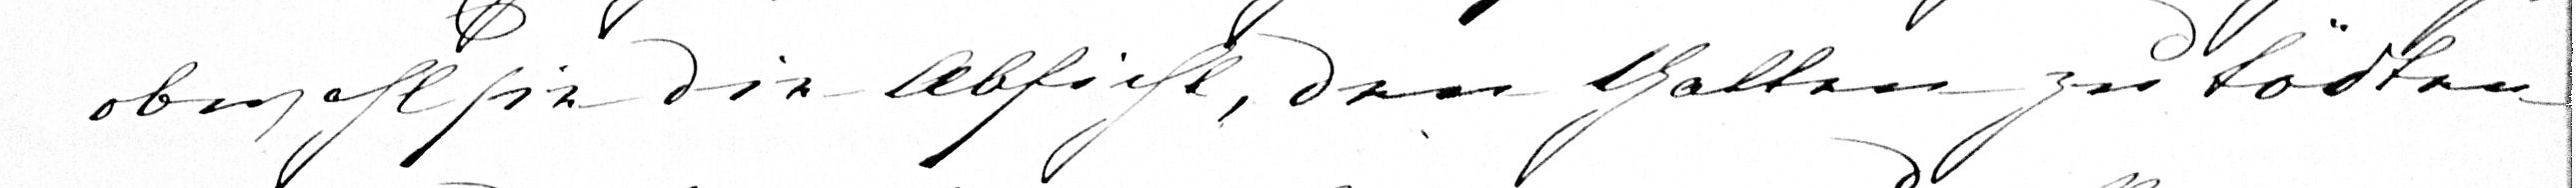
obwohl sie die Absicht, den Gatten zu tödten¬
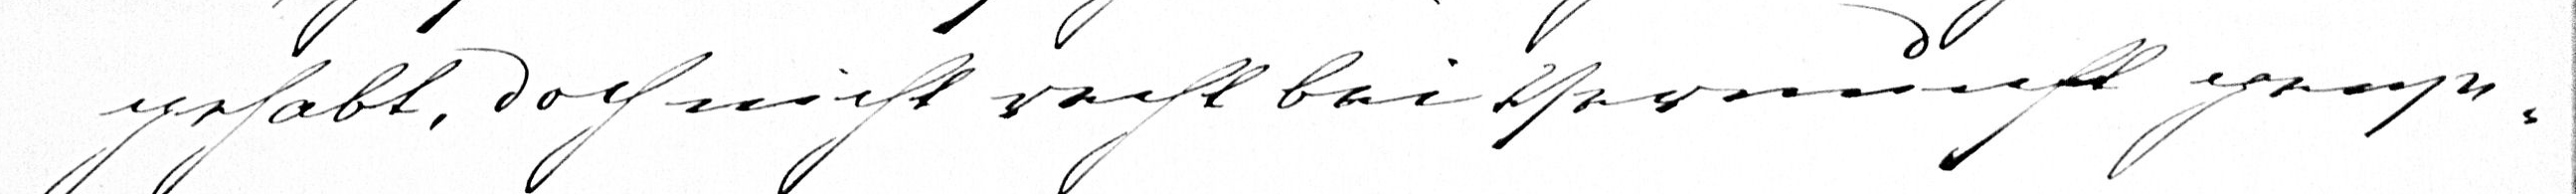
gehabt, doch nicht recht bei Vernunft gewe¬
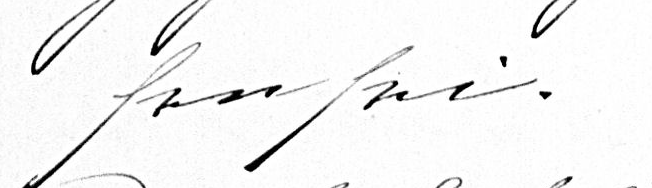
sen sei.
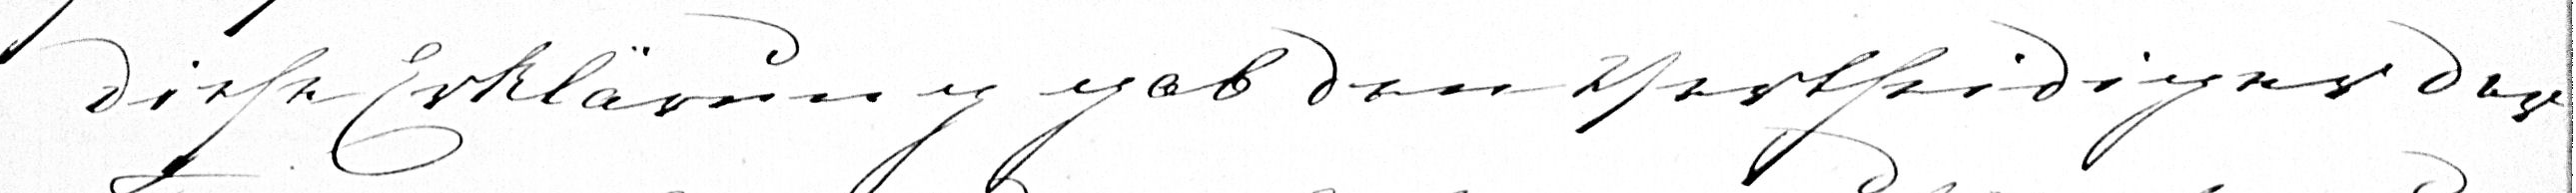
Diese Erklärung gab den Vertheidiger der
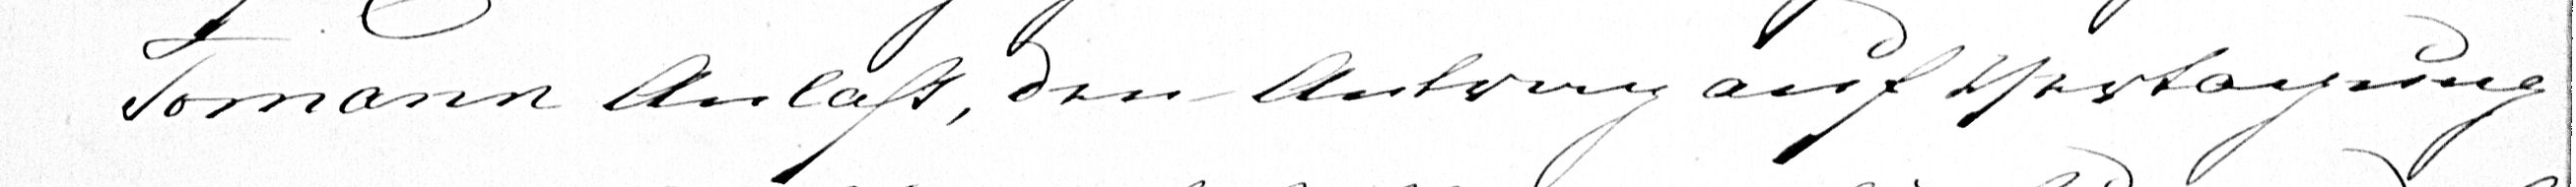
Tomann Anlaß, den Antrag auf Vertagung
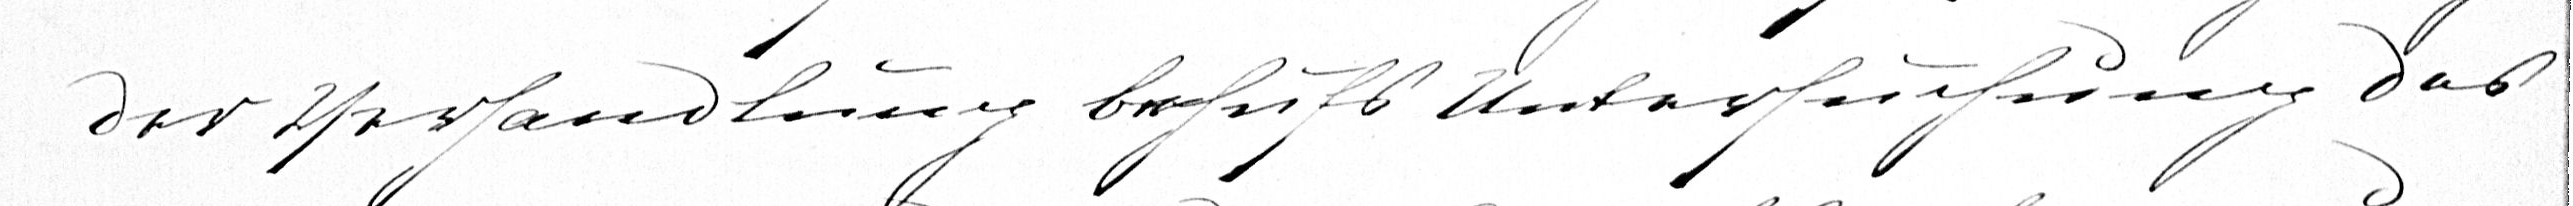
der Verhandlung behufs Untersuchung des
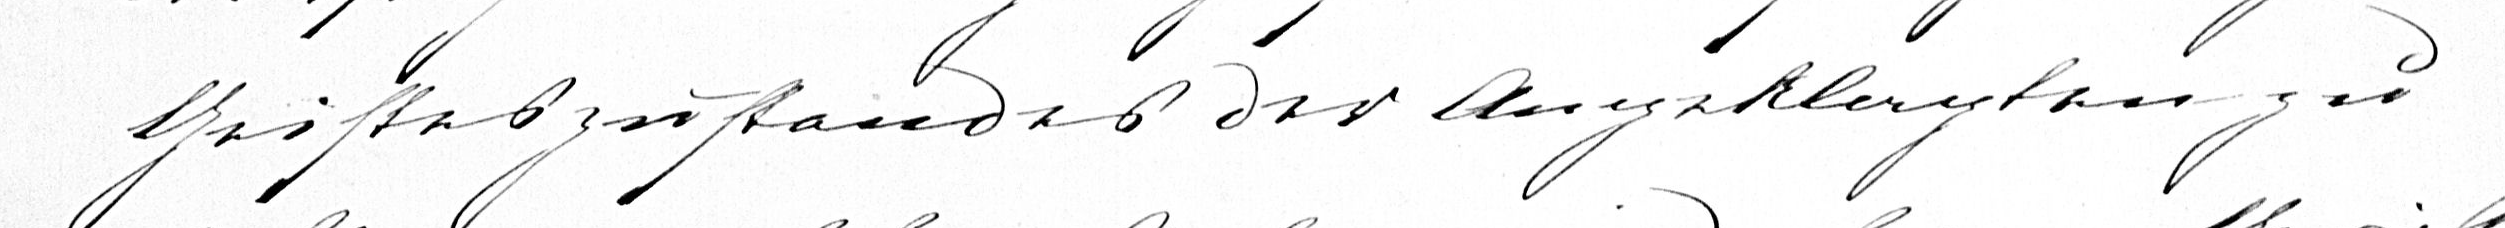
Geisteszustandes der Angeklagten zu
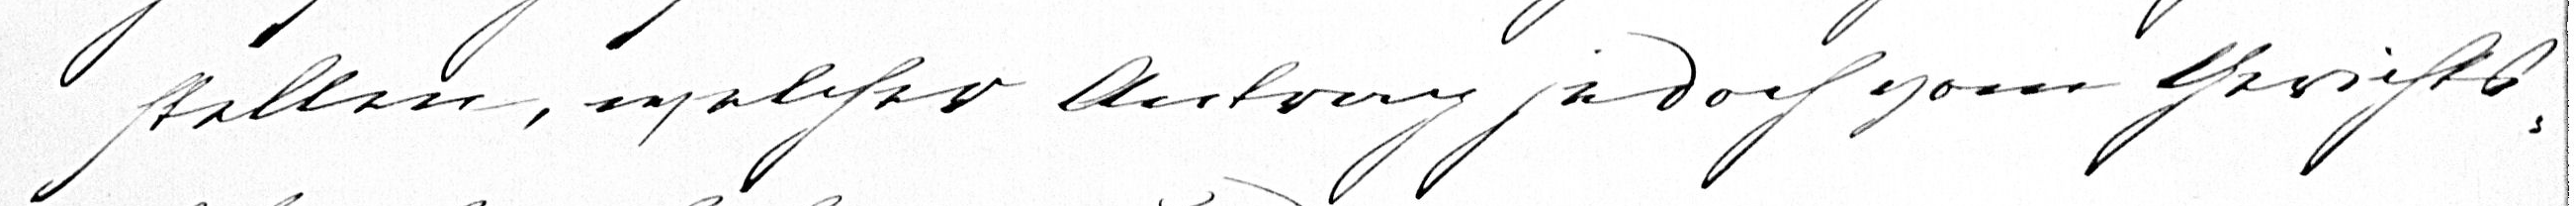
stellen, welcher Antrag jedoch vom Gerichts¬
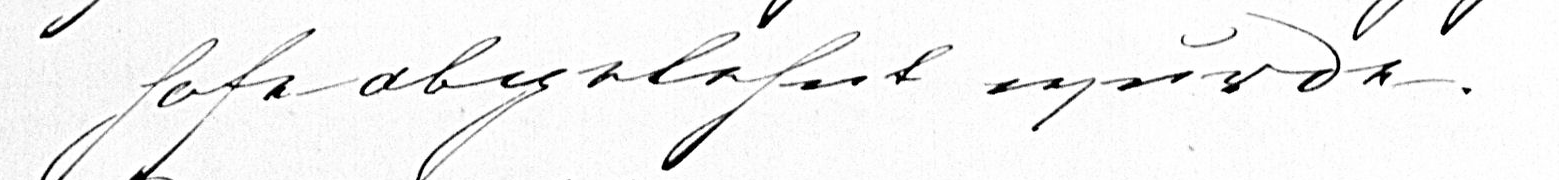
hofe abgelehnt wurde.
